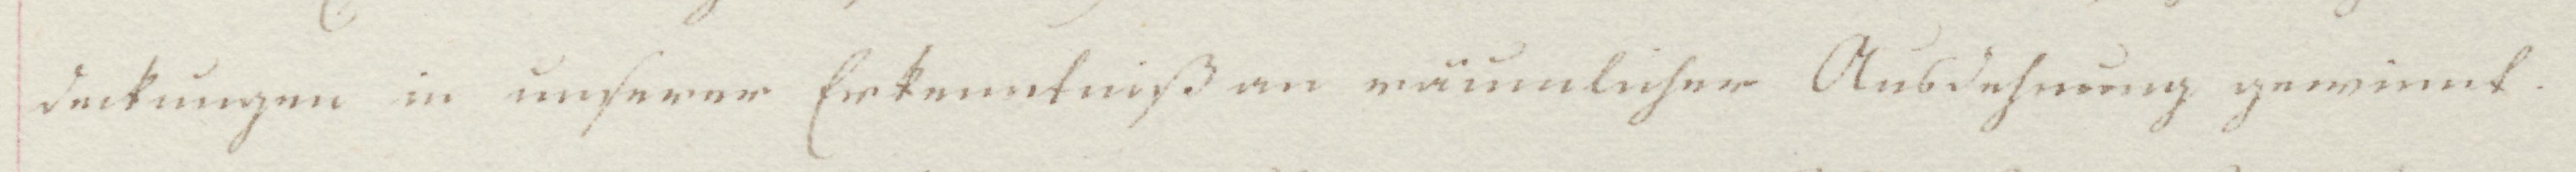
deckungen in unserer Erkenntniß an räumlicher Ausdehnung gewinnt.
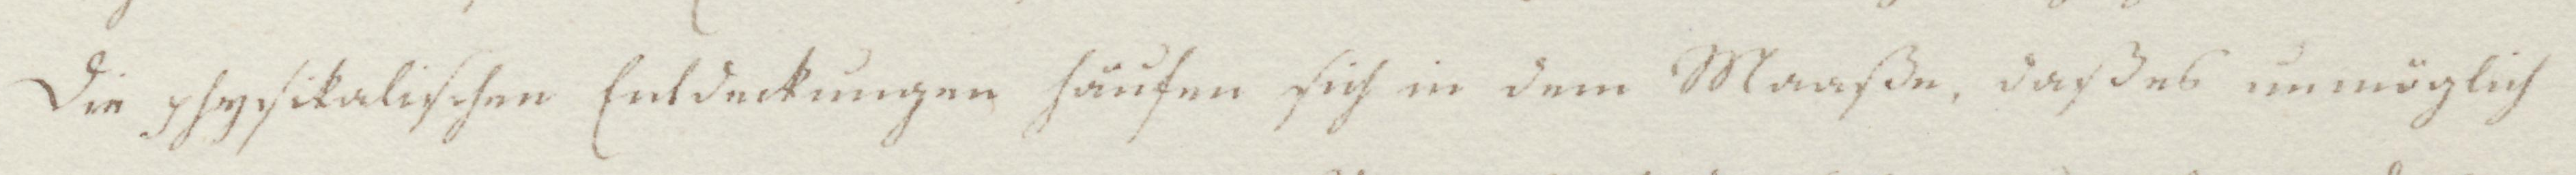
Die physikalischen Entdeckungen häufen sich in dem Maaße, daß es unmöglich
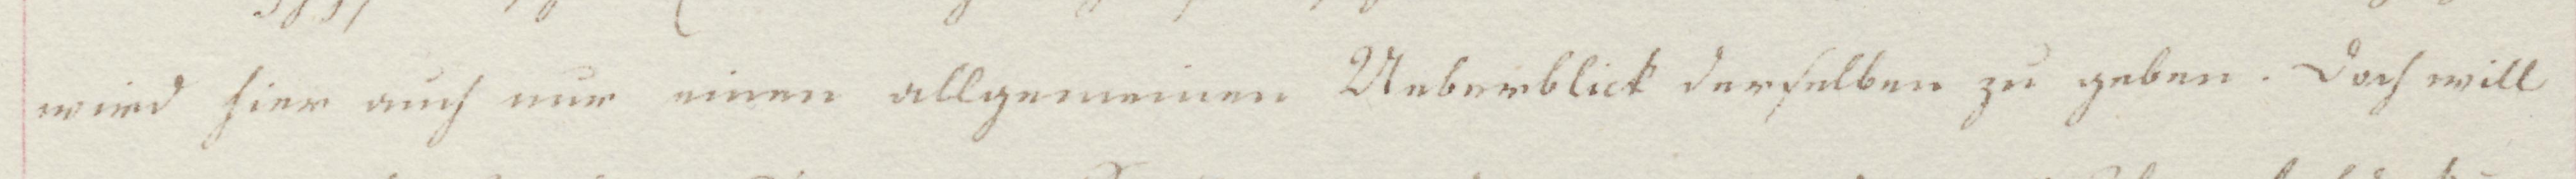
wird hier auch nur einen allgemeinen Ueberblick derselben zu geben. Doch will
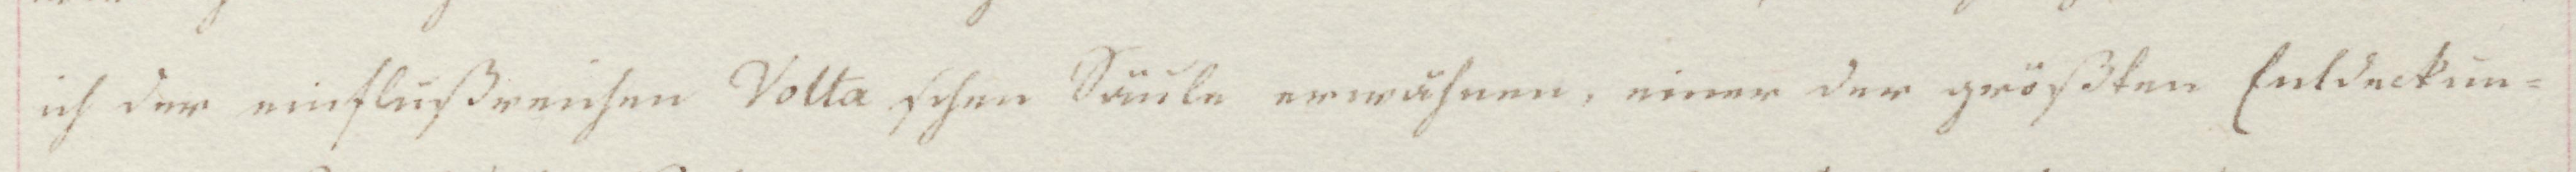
ich der einflußreichen Voltaschen Säule erwähnen, einer der größten Entdeckun-
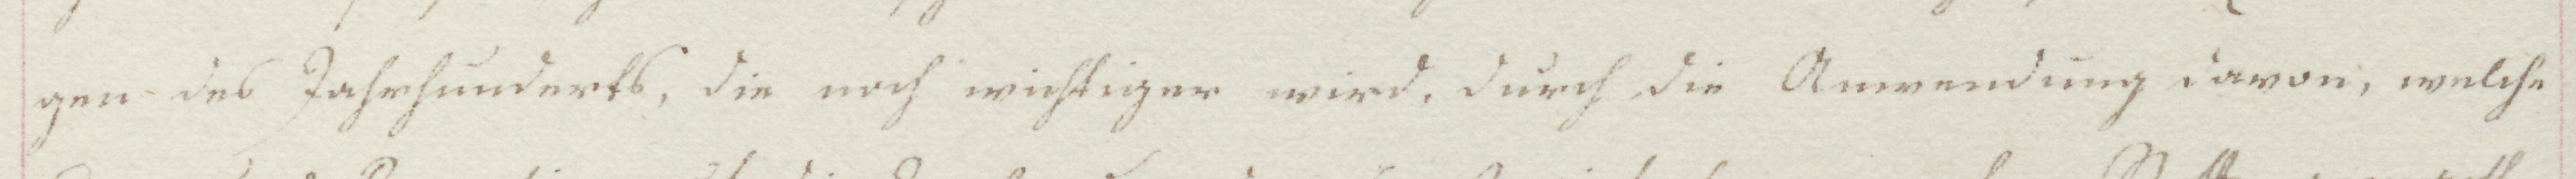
gen des Jahrhunderts, die noch wichtiger wird, durch die Anwendung davon, welche
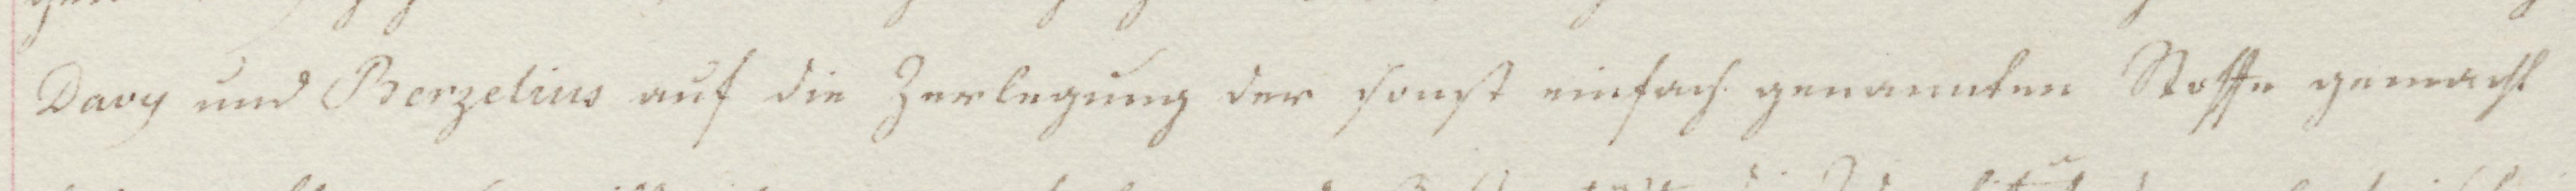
Davy und Berzelius auf die Zerlegung der sonst einfach genannten Stoffe gemacht
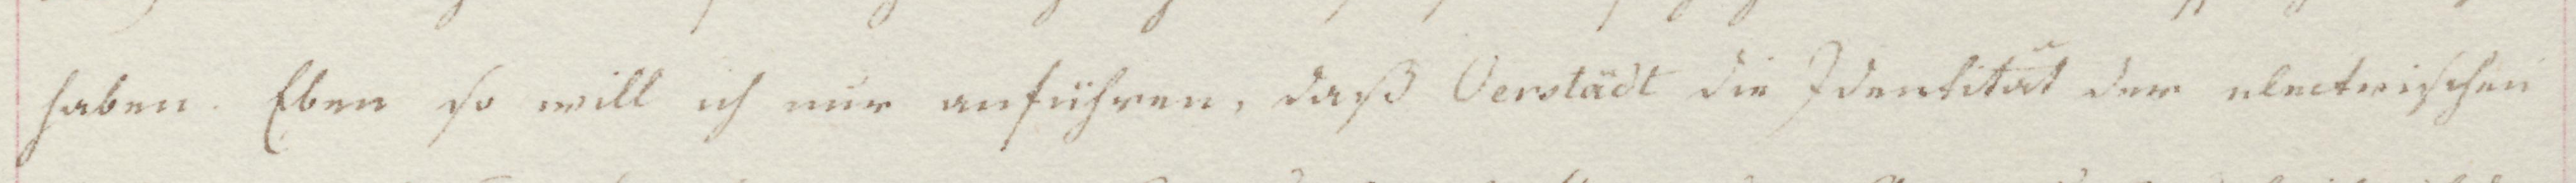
haben. Eben so will ich nur anführen, daß Oerstädt die Identität der electrischen
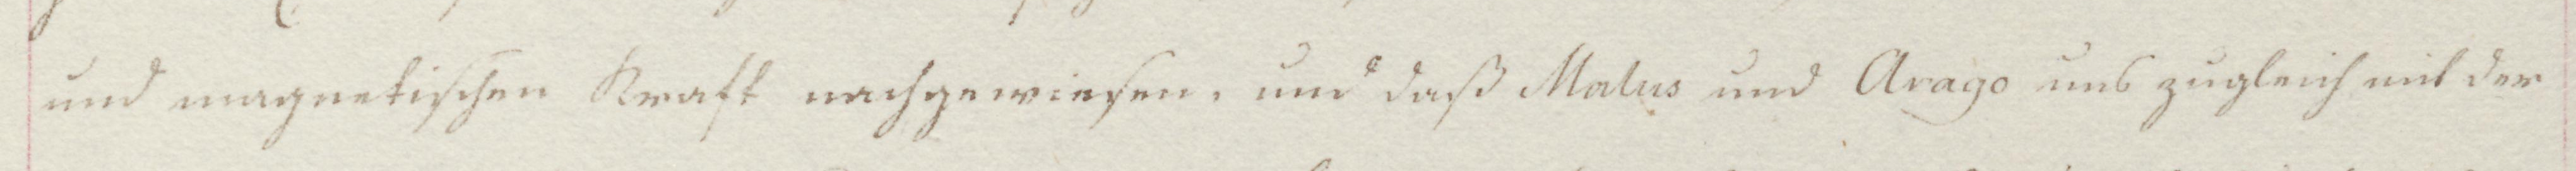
und magnetischen Kraft nachgewiesen, und daß Malus und Arago uns zugleich mit der
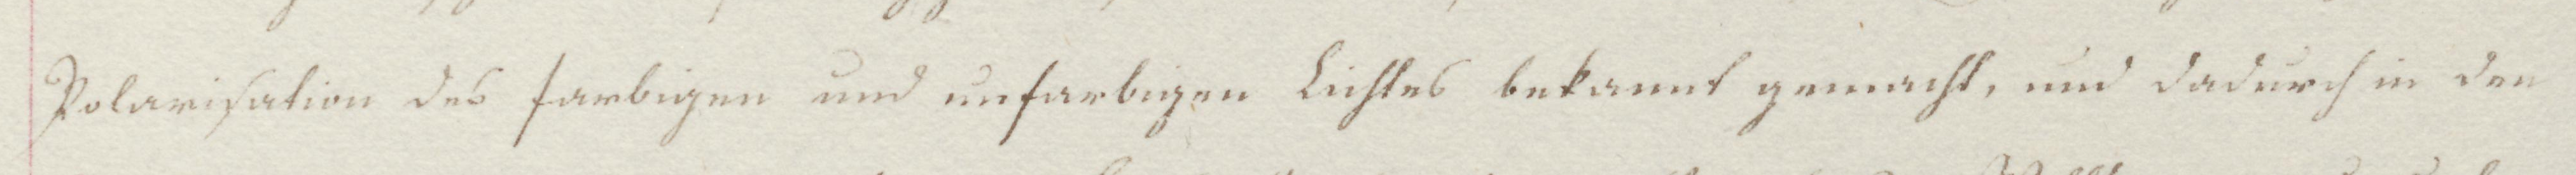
Polarisation des farbigen und unfarbigen Lichtes bekannt gemacht, und dadurch in den
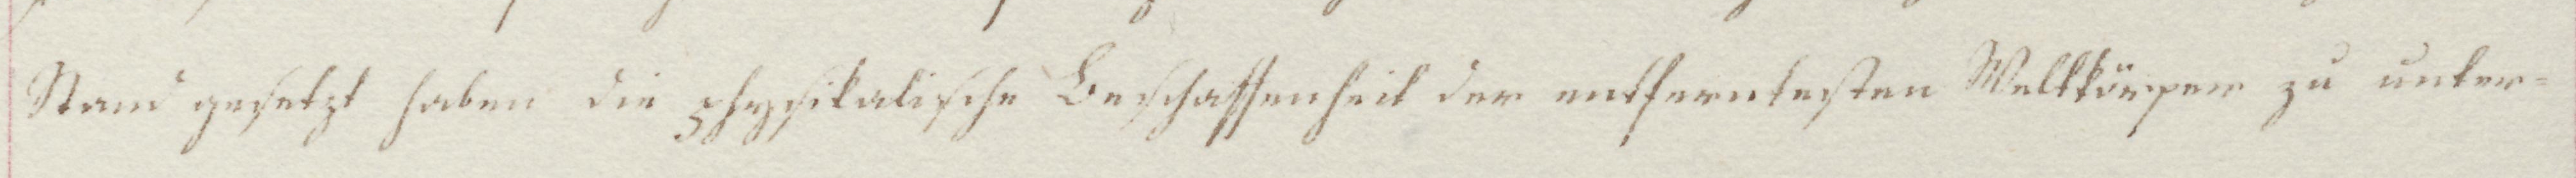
Stand gesetzt haben die physikalische Beschaffenheit der entferntesten Weltkörper zu unter-
